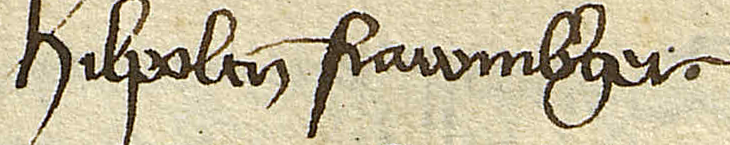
Hilpoltn* frawmb*ger
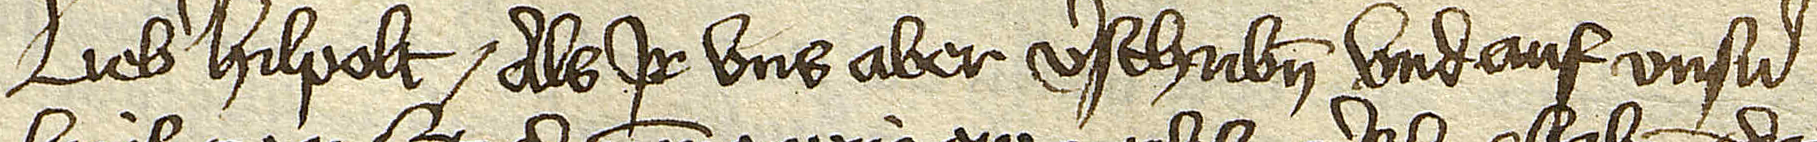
Lieb* hilpolt / Als Ir vns aber v*ſchribn* vnd auf vnſn*
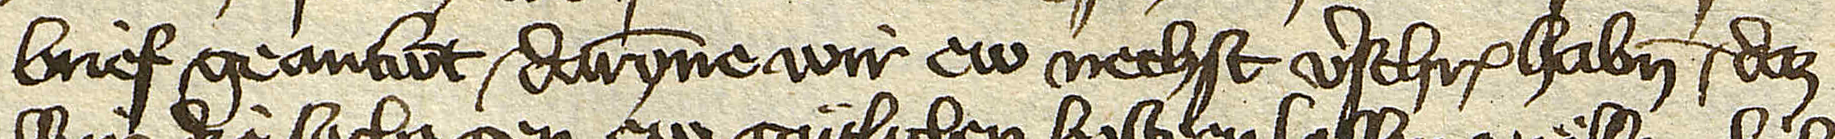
brief geantwt* / daryne* wir ew nechſt v*ſchr* habn* / daʒ
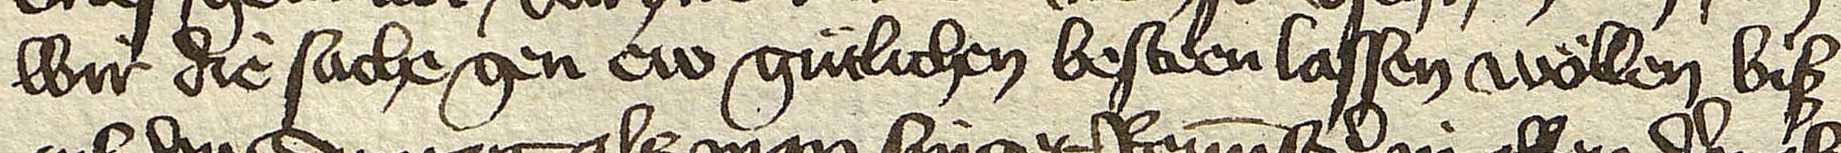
wir die ſache gen ew gütlichen beſteen laſſen wöllen biſʒ
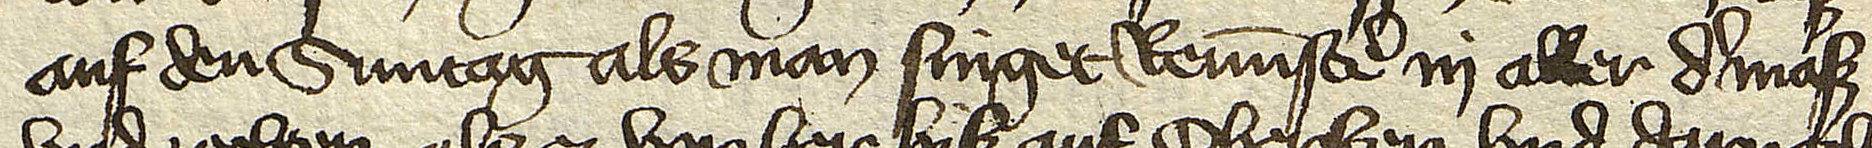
auf den Suntag als man ſinget Reim*ſce* in aller d*maſʒ
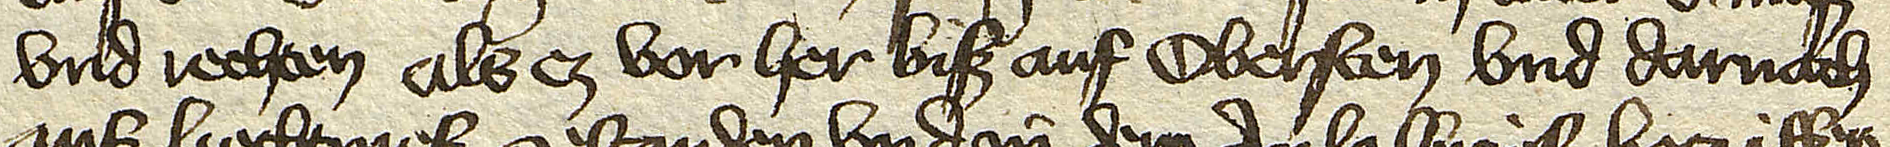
vnd rechten als eʒ vor her biſʒ auf Oberſten vnd darnach
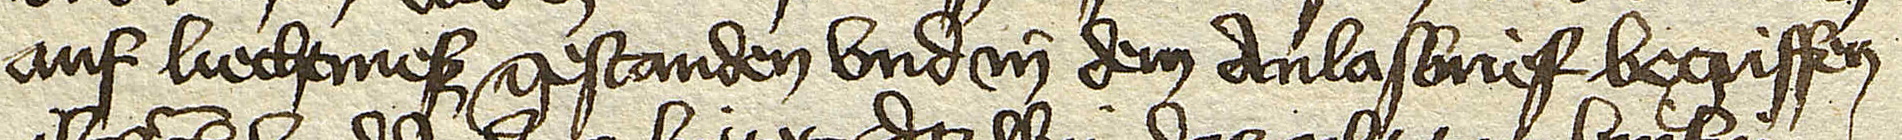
auf liechtmeſʒ geſtanden vnd in dem Anlaſbrief begriffen
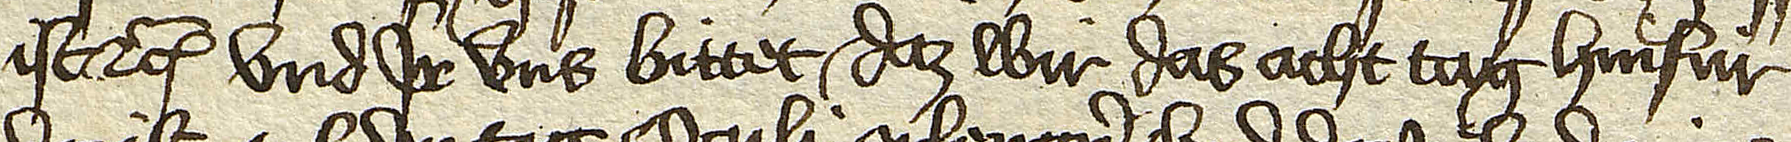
iſt ec* vnd Ir vns bittet / daʒ wir das acht tag hinfür
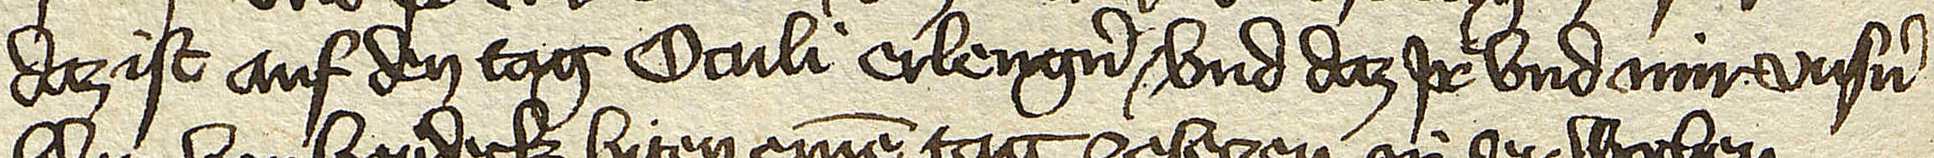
daʒ iſt auf den tag Oculi erlengn* / vnd daʒ Ir vnd mit vnſn*
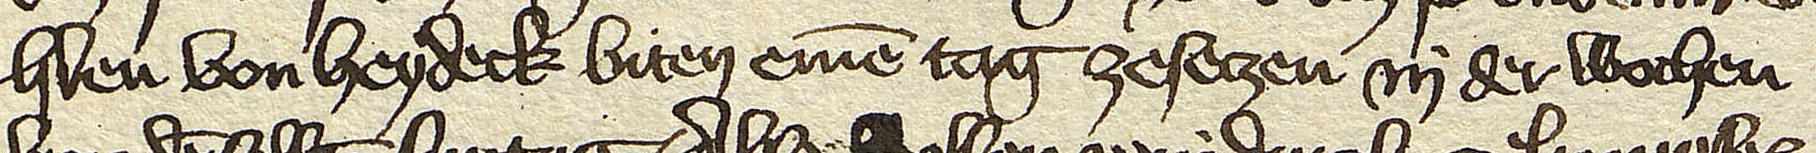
hr*en von heydeck biten eine* tag cʒeſecʒen in der wochen
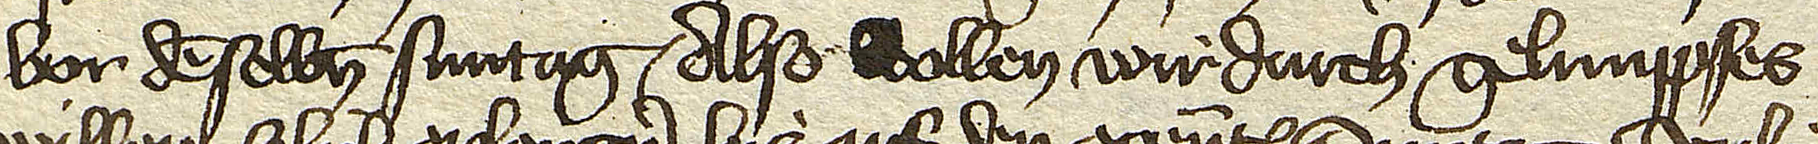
vor de*ſelbn* ſuntag / Alſo wollen wir durch gelimppfes
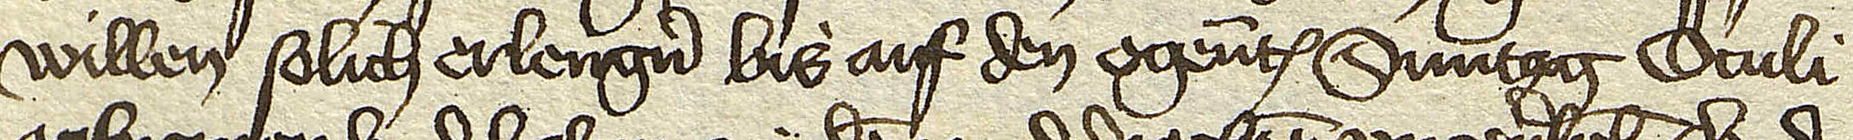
willen ſolich erlengn* bis auf den egent* Suntag Oculi
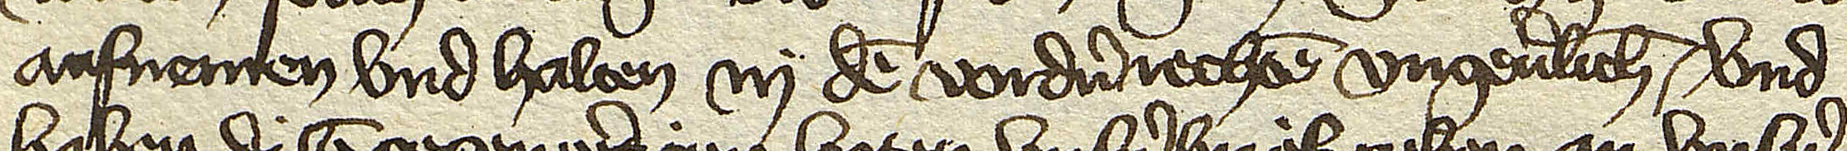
aufnemen vnd halten in de* vordn* rechte* vngeu*lich* / vnd
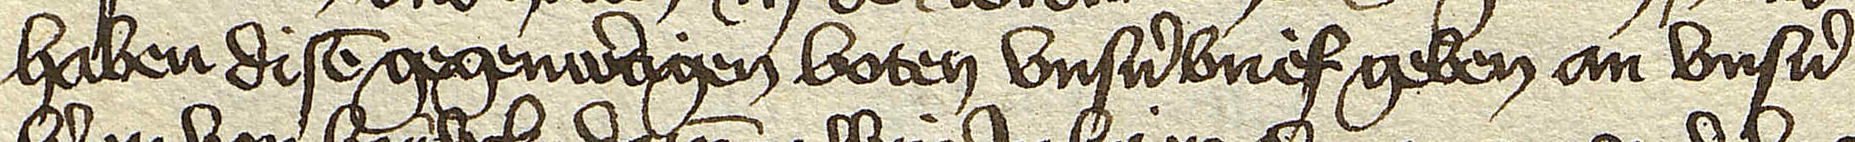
haben diſe* gegenw*tigen boten vnſn* brief geben an vnſn*
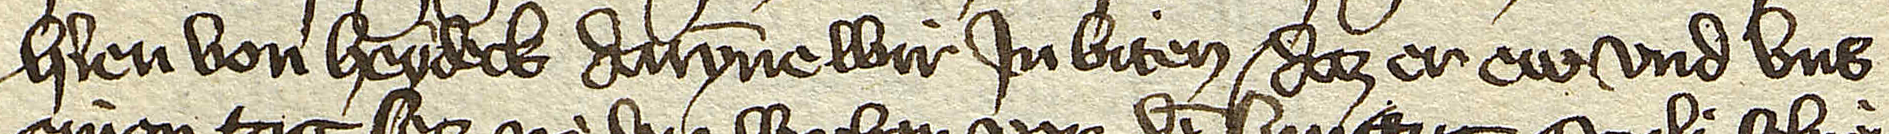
h*ren von heydeck daryne* wir In biten / daʒ er ew vnd vns
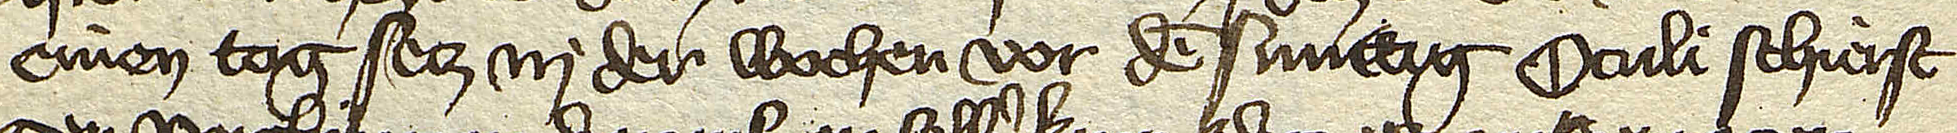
einen tag ſecʒ in der wochen vor de* ſuntag Oculi ſchierſt
